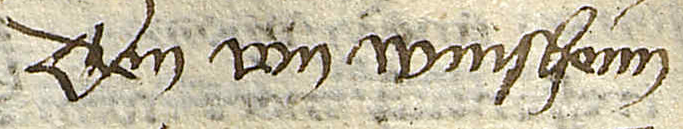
Den von winſheim
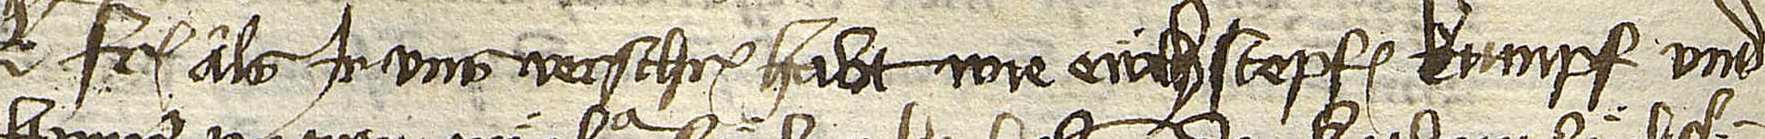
L* fr* als Ir vns verſchr* wie eẅch ſtepf* kumpf vnd
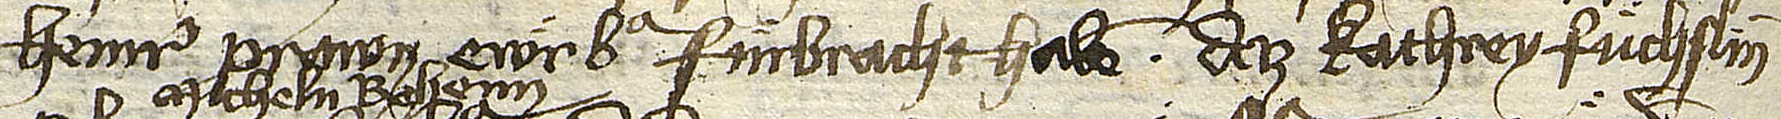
heinr* prawn eẅr b* fürbracht habe* . daʒ kathrey füchſlin*
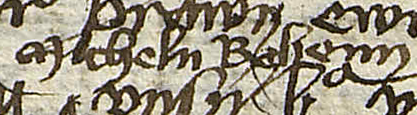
Micheln Beheim
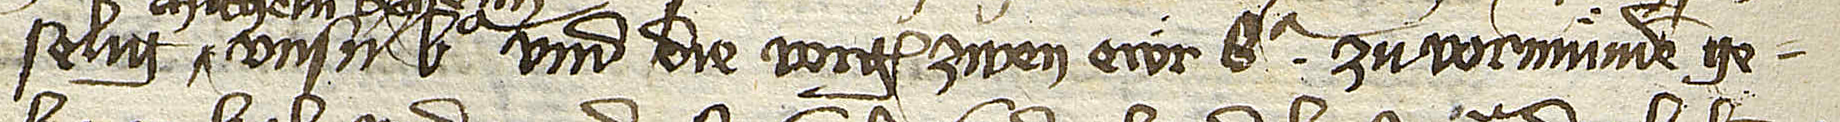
ſelig vnſ*n b* vnd die vorg* ʒwen eẅr b* . ʒu vormünde* ge =
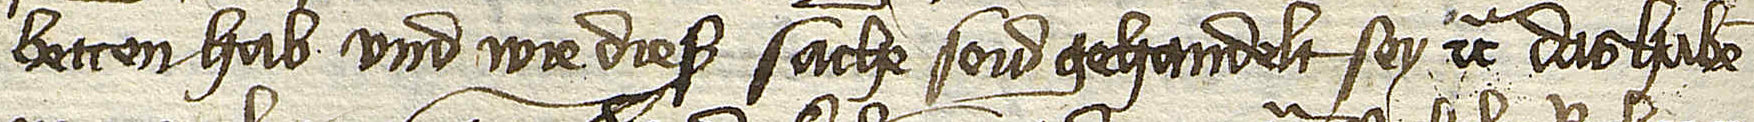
betten hab vnd wie dieſ* ſache ſeid gehandelt ſey ec* das habe*
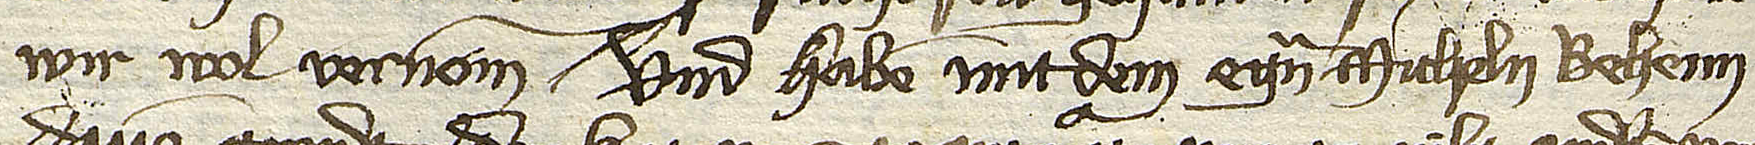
wir wol vernom* / Vnd habe* mit dem eg*n Micheln Beheim
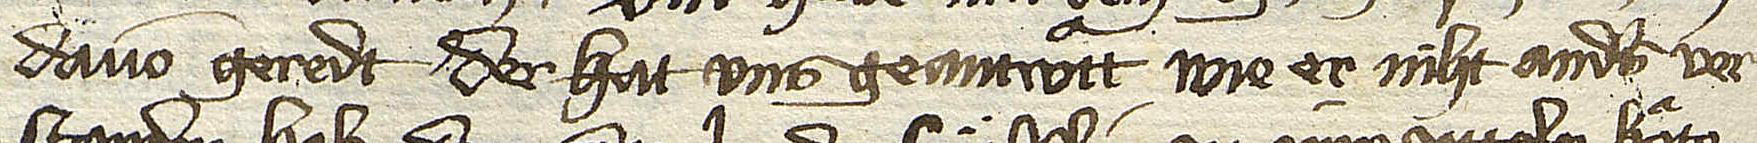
dauo* geredt / Der hat vns geantw*tt wie er niht and*s ver =
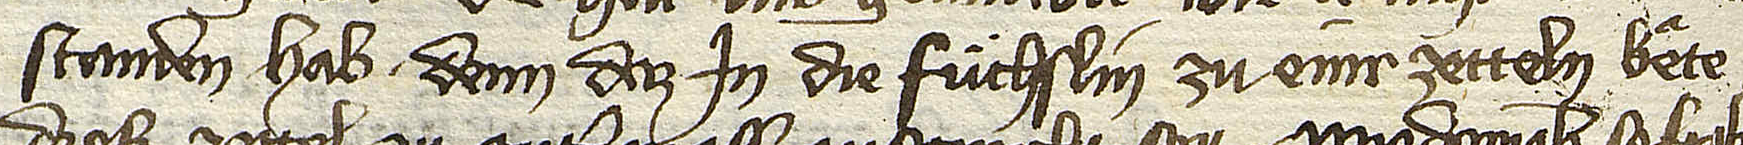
ſtanden hab . denn daʒ In die füchſlin ʒu einr ʒetteln bëte
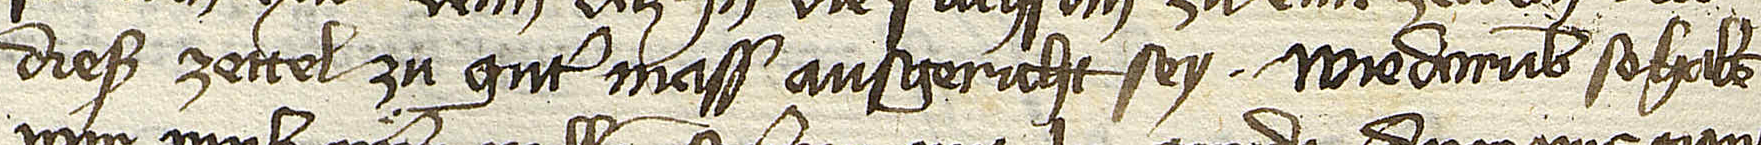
dieſ* ʒettel ʒu gut* maſſ aufgericht ſey . wie darub* ſo habe*
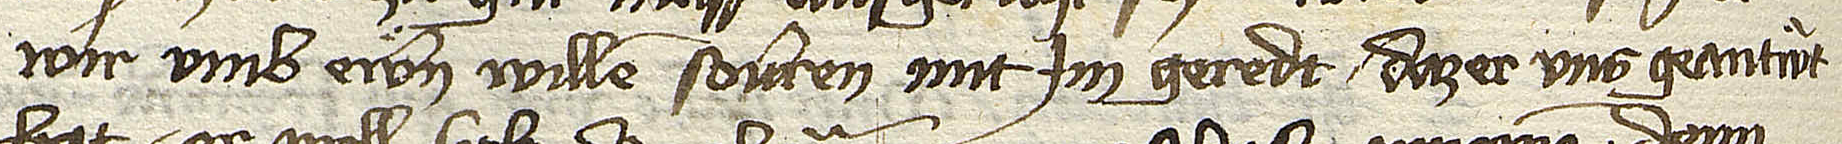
wir vmb eẅ*n wille* ſouren* mit Im geredt / daʒ er vns geantw*t
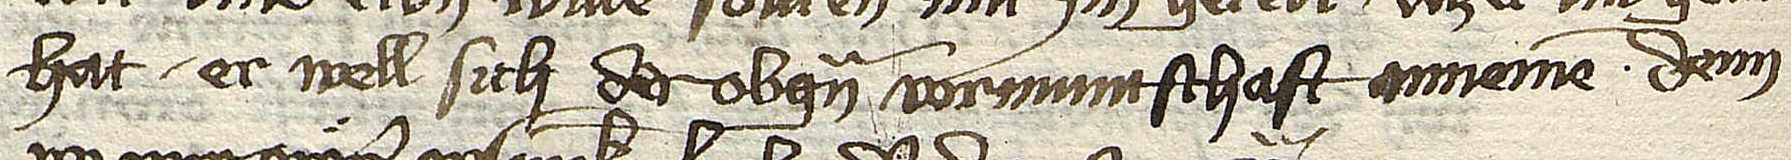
hat / er well ſich der obg*n vormuntſchaft anneme* . denn
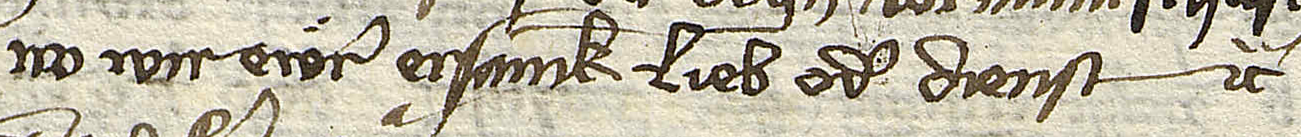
wo wir eẅr* erſamk* lieb od* dienſt ec*
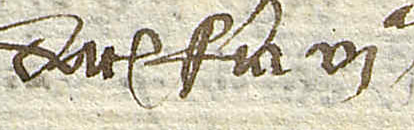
dat* fia* vi*
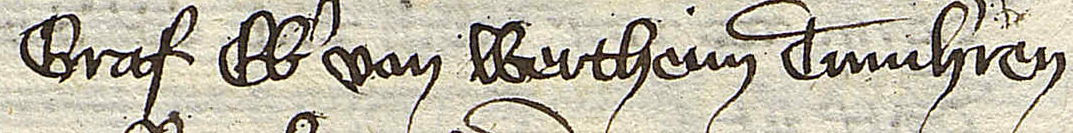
Graf Eb* von Wertheim Tumhren*
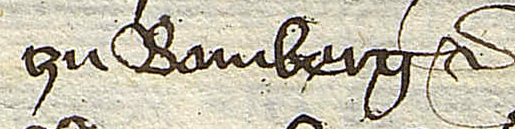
cʒu Bamberg* ec*
